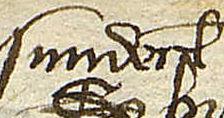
ſunderl*
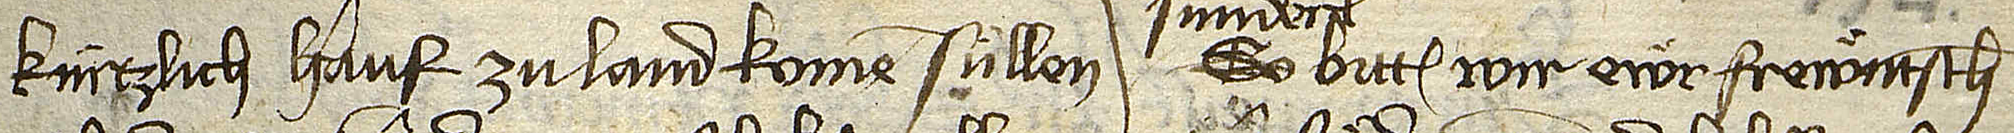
kürcʒlich hauf* ʒu land kome* ſüllen So bitt* wir ewr frewntſch*
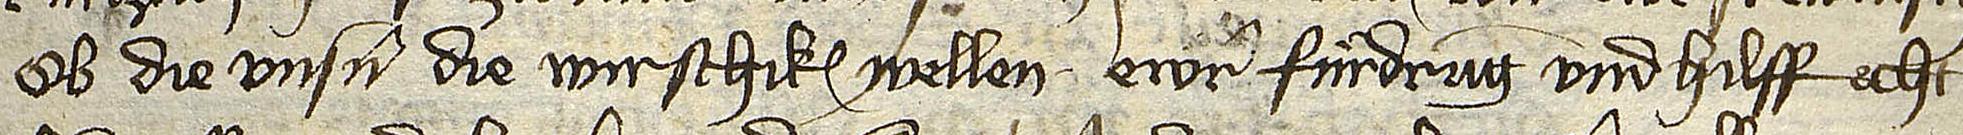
ob die vnſ*n die wir ſchik* wellen . ewr* fürdru*g vnd hilff icht
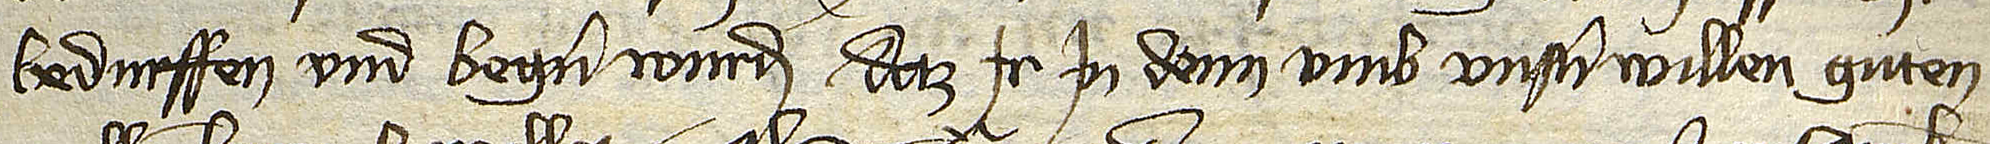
bedurffen vnd beg*n wurd* / daʒ Ir In denn vmb vnſ*n willen guten
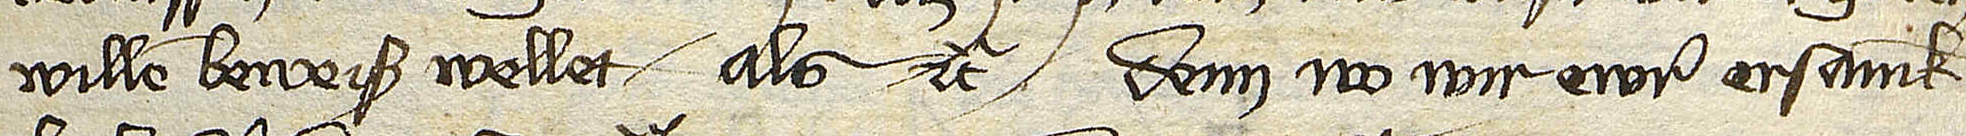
wille* beweiſ* wellet / als ec* Denn wo wir ewr* erſamk*
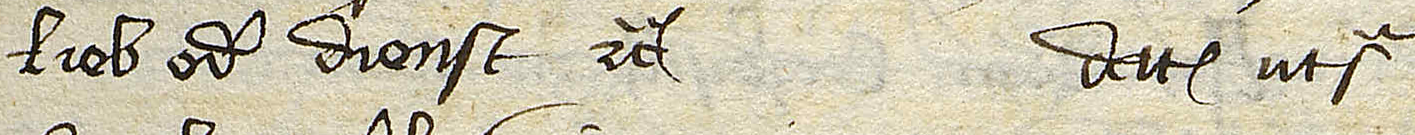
lieb od* dienſt ec* Dat* ut ſ*
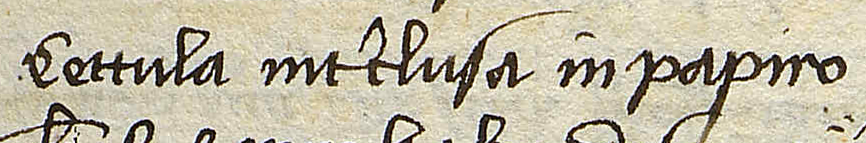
Cettula int*cluſa in papiro
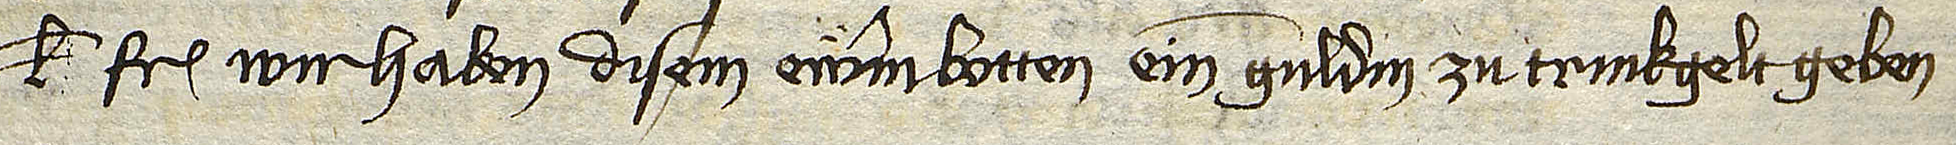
L* fr* wir haben diſem ew*m botten ein* guldin ʒu trinkgelt geben
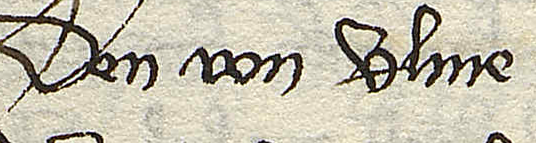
Den von Vlme
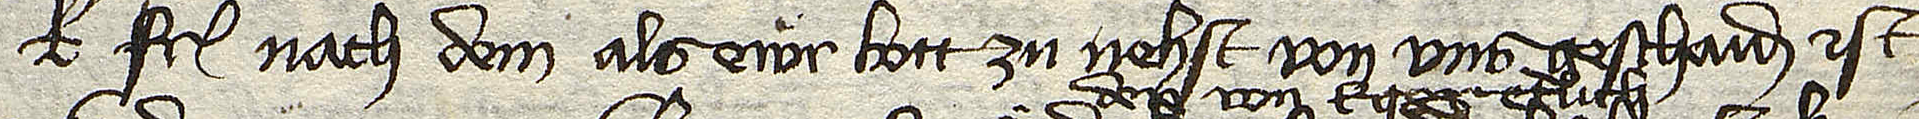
L* fr* nach dem als ewr bott ʒu nehſt von vns geſchaid* iſt
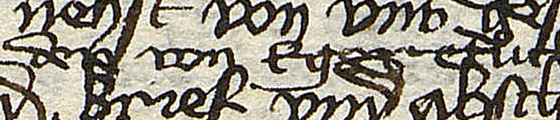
den von Eger etlich
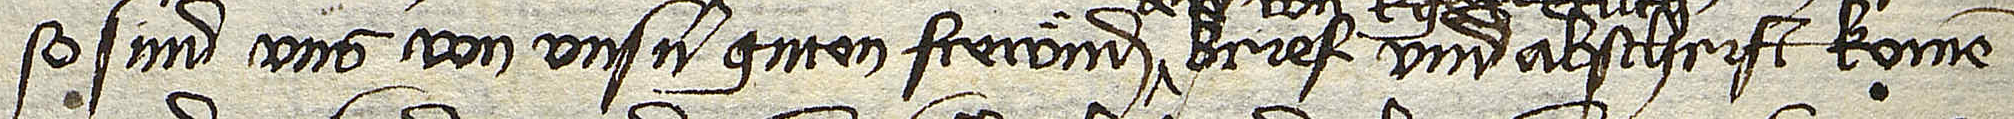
ſo ſind vns von vnſ*n guten frewnd* brief vnd abſchrift kome*
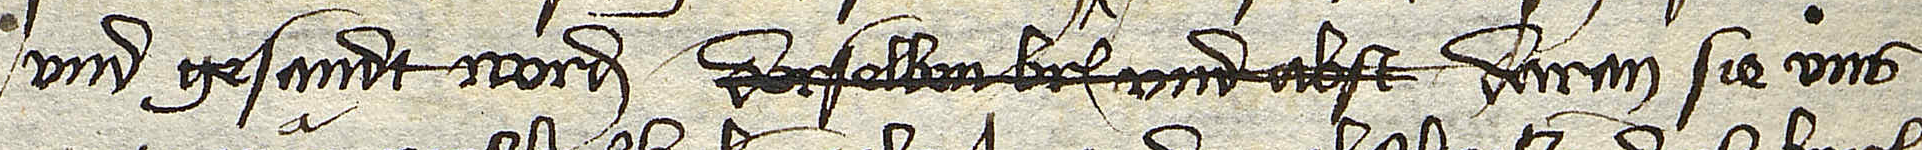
vnd geſandt word* / Derſelben br* vnd abſc Daran ſie vns
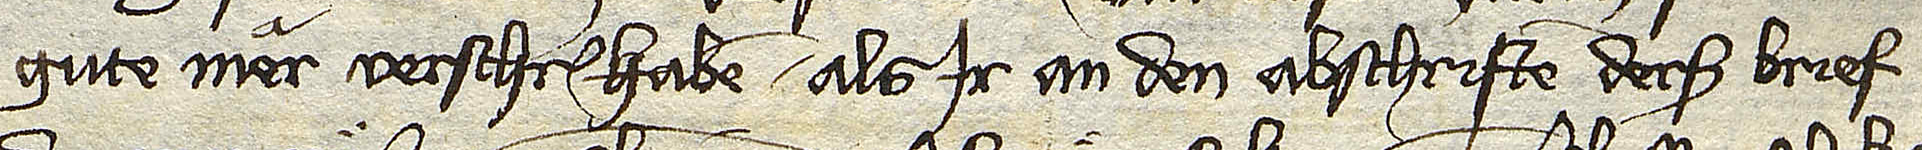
gute mër verſchr* habe* / als Ir an den abſchrifte* derſ* brief
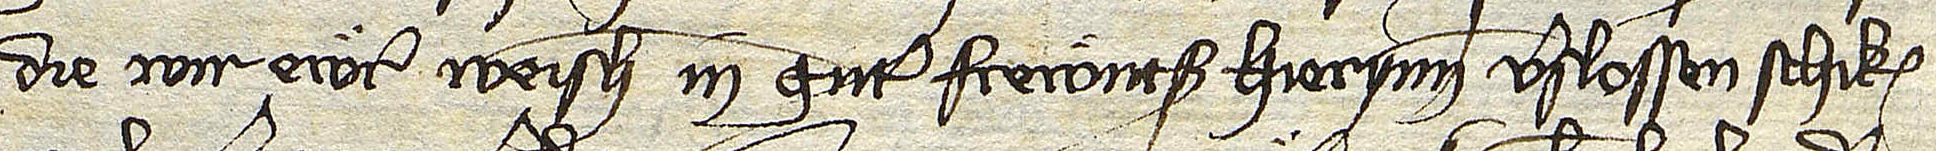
die wir ew*r weiſh* in gut* frewntſ* hierynn* v*ſloſſen ſchik*
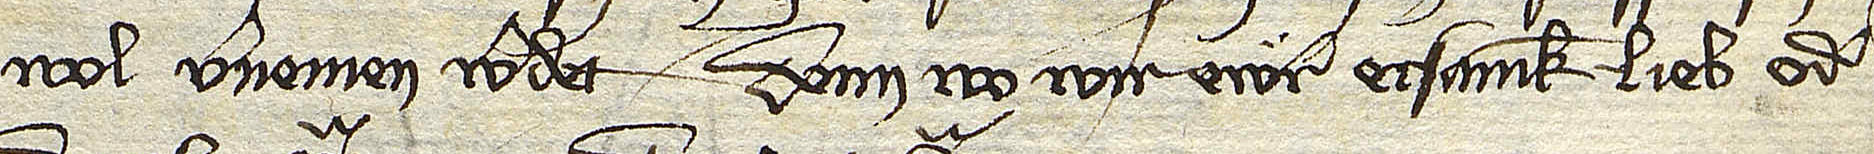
wol v*nemen w*det / Denn wo wir ewr* erſamk* lieb od*
